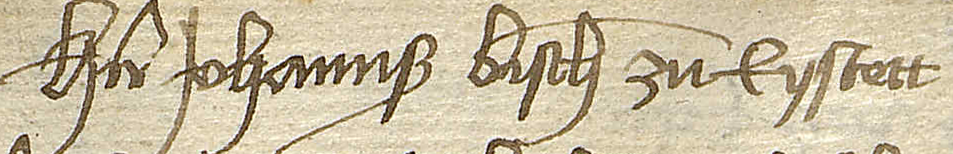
Hn* Iohannſ* biſh* ʒu Eyſtett
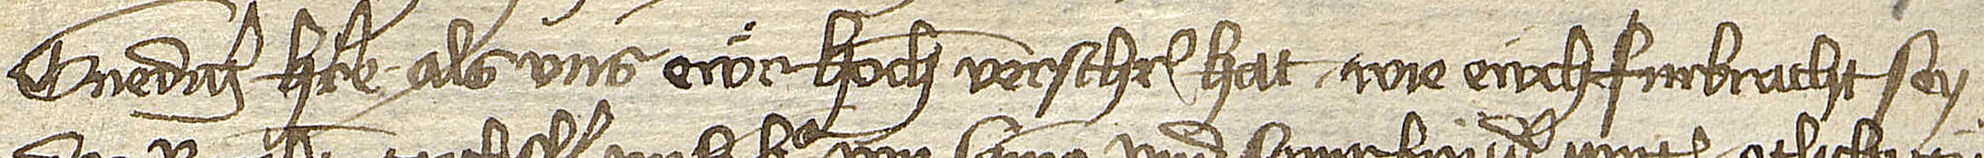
Gnedig* h*re / als vns eẅr hoch* verſchr* hat / wie eẅch furbracht ſey
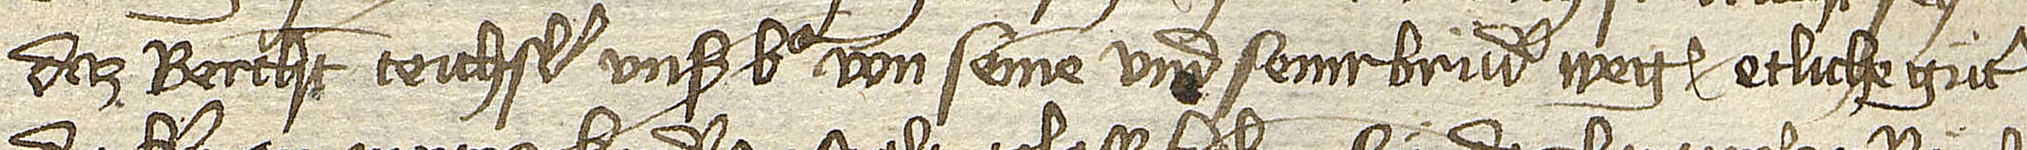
daʒ Bercht* teichſl* vnſ* b* von ſeine* vnd ſeinr brüd* weg* / etliche güt*
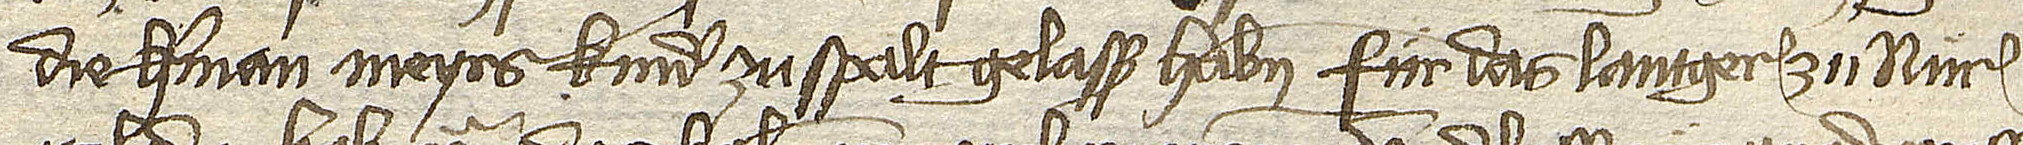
die h*man meyrs kind* ʒu ſpalt gelaſſ* habn* für das lantger* ʒu Nür*
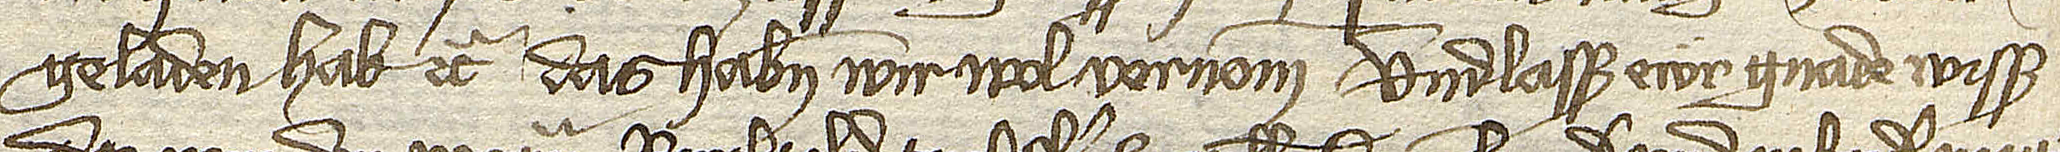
geladen hab ec* das habn* wir wol vernom* / Vnd laſſ* eẅr gnade wiſſ*
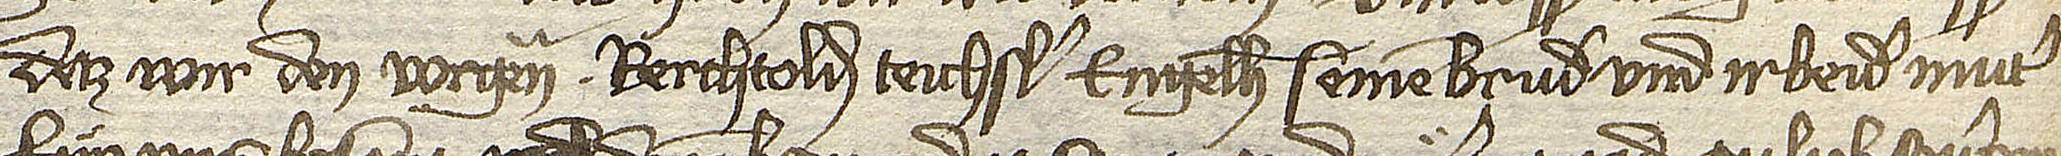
Daʒ wir den vorgen* . Berchtold* teichſl* Engelh* ſeine* brud* vnd ir beid* mut*
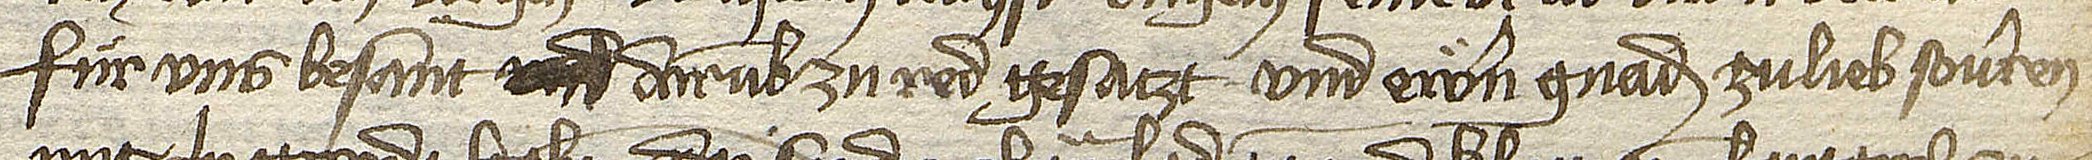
für vns beſant vnd darub* ʒu red geſacʒt vnd eẅ*n gnad* ʒu lieb ſou*ren
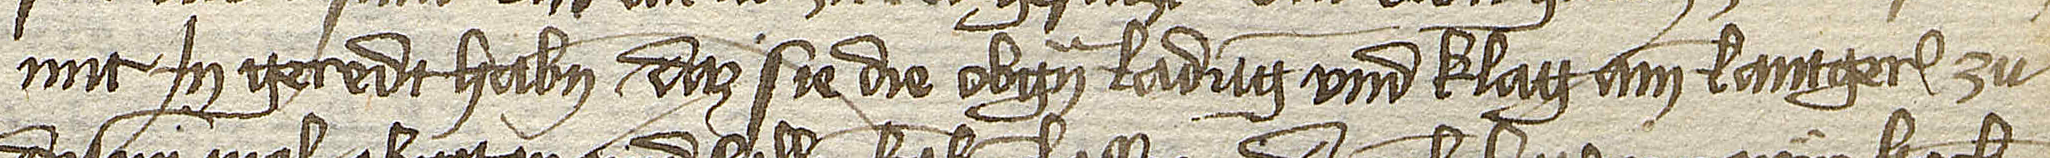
mit In geredt habn* / Daʒ ſie die obgn* ladu*g vnd klag am* lantger* ʒu
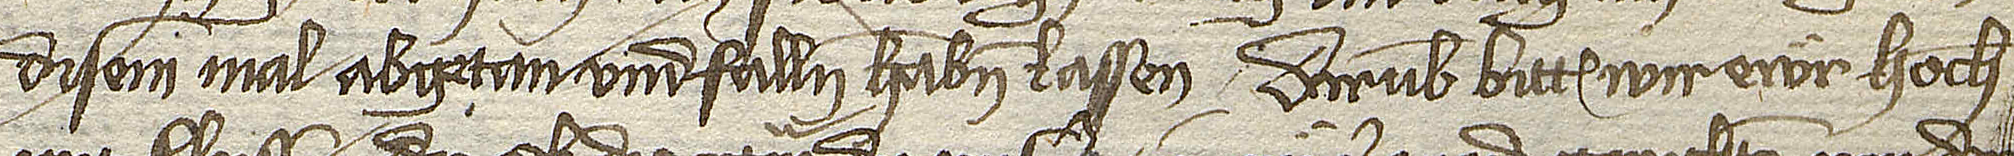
diſem mal abgetan vnd falln* habn* laſſen / Darub* bitt* wir eẅr hoch*
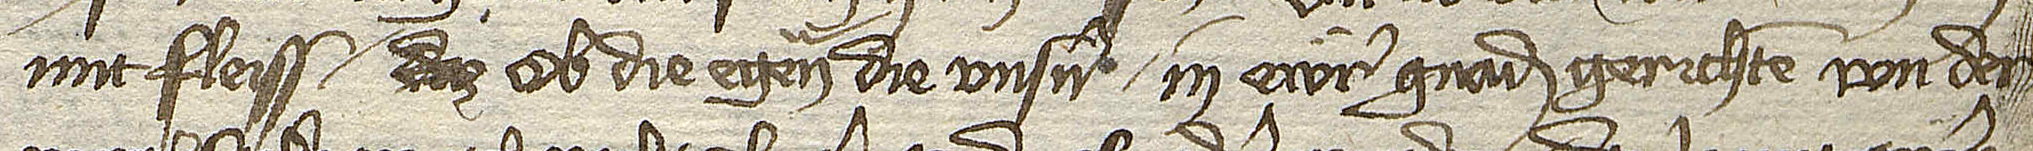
mit fleiſſ / Daʒ Ob die egen* die vnſn* / in eẅr* gnad* gerichte* von der
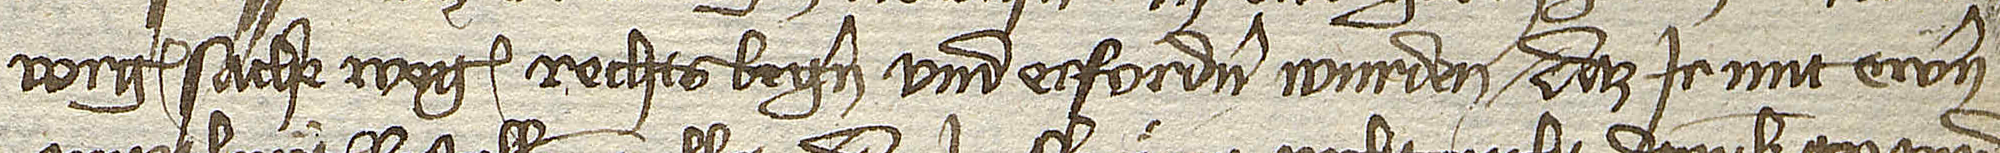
vorg* ſache weg* rechts beg*n vnd erfordn* wurden / Daʒ Ir mit eẅ*n
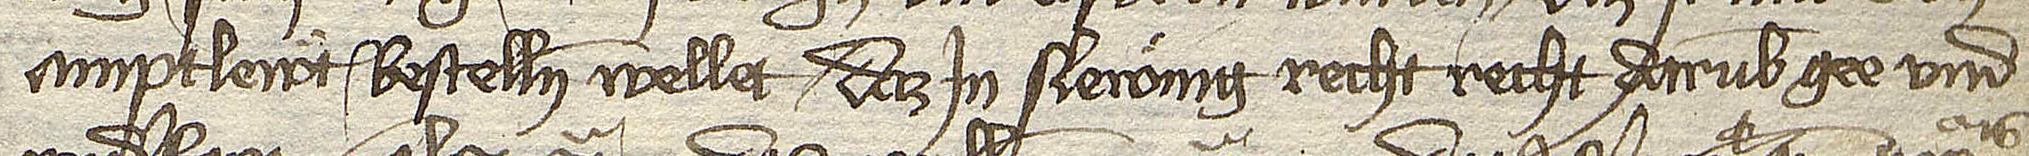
amptleẅt* beſtelln* wellet / Daʒ In ſleẅnig recht recht darub* gee vnd
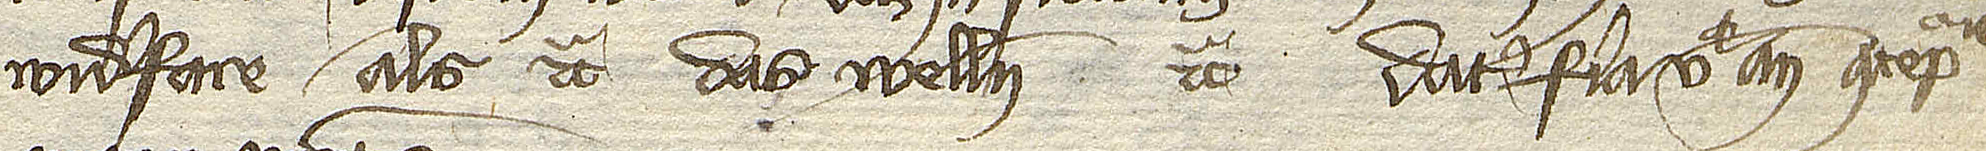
wid*fare / als ec* Das welln* ec* Dat* fi*a v* an* *cep*
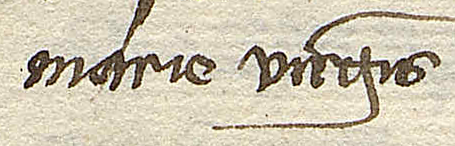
marie virg*is
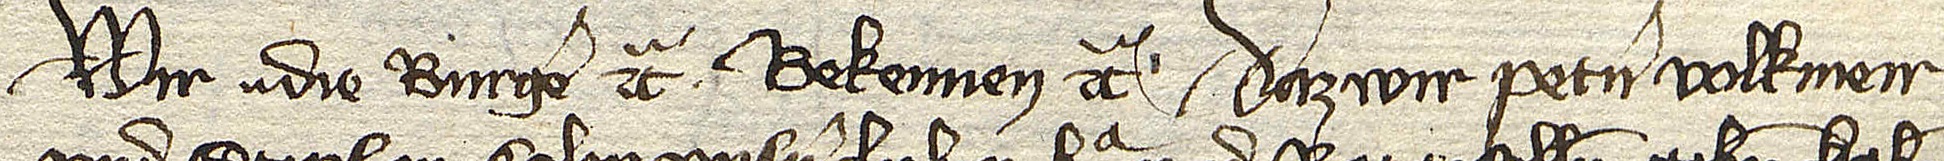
Wir ~ die Bürge* ec* . Bekennen ec* / Daʒ wir petn* volkmeir
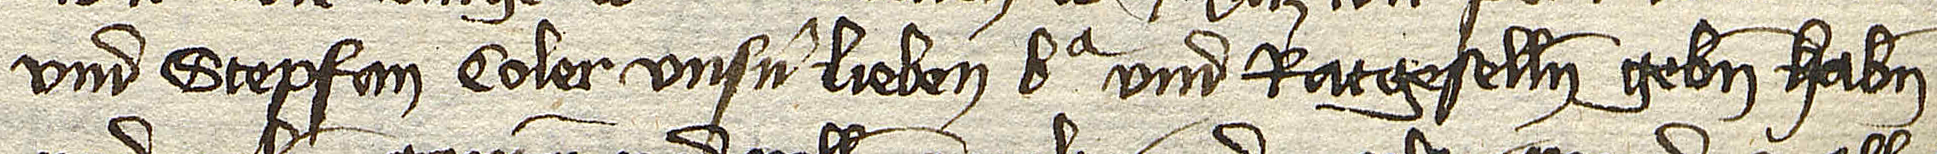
vnd Stepfan Coler vnſn* lieben b* vnd Ratgeſelln* gebn* habn*
